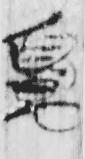○（夏）
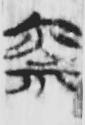○（夕）
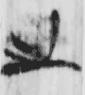之
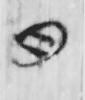月
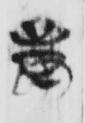庚
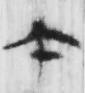午
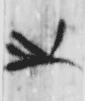之
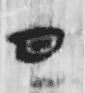日
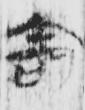命（令）
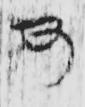尹
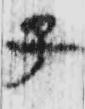子
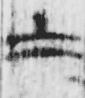士
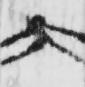大
